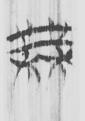無
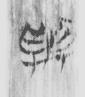與
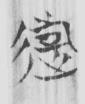遊
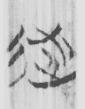述
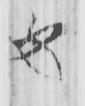女
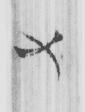又
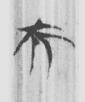夫
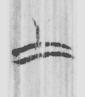士
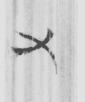又
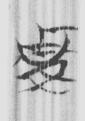妻
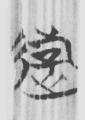遊
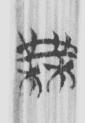無
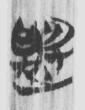𪴿
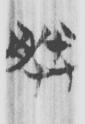朕
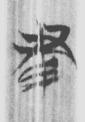𦘔
